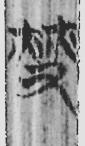{火火又}
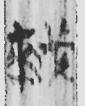{戈戈}
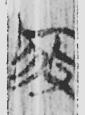{戶攴}（啟）
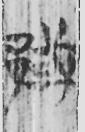{或阝}
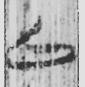㠯（以）
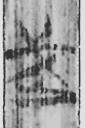武
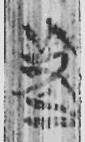{及止}
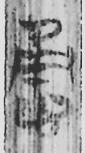恿
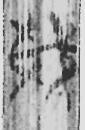{爻戈}
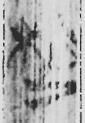{相止}
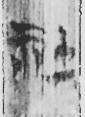社
